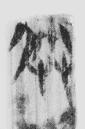{人灷}
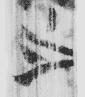之
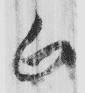㠯（以）
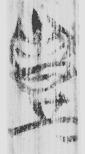豊
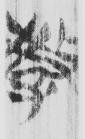教
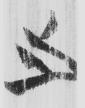之
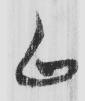㠯（以）
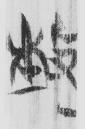{坴攴}
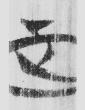正
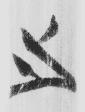之
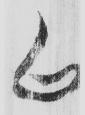㠯（以）
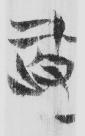政
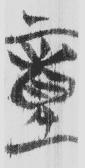童
